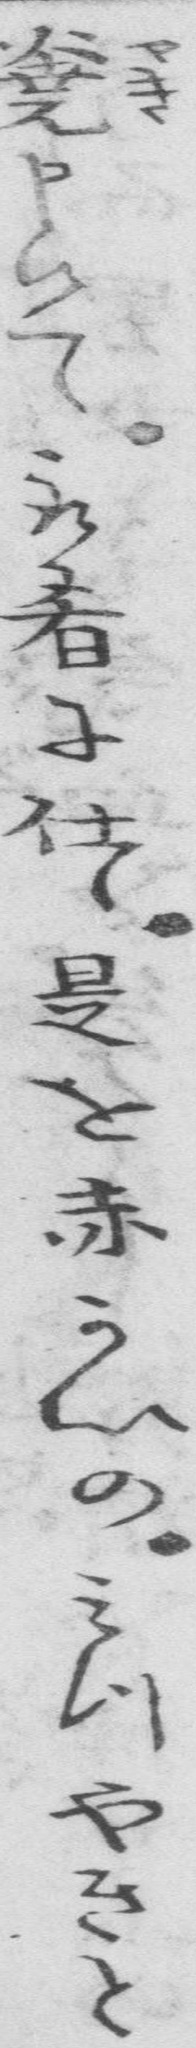巻申候て。取肴に仕候。是を赤かいの。みつやきと

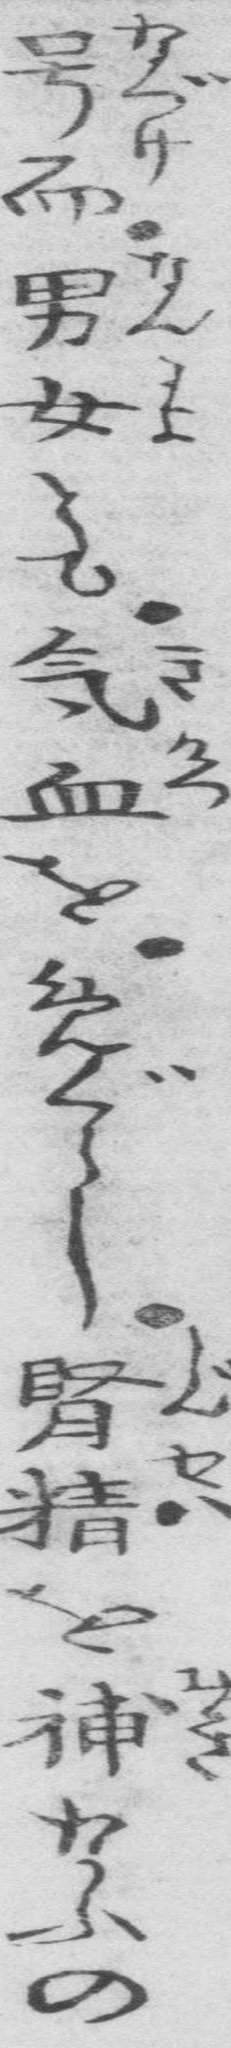号而。男女とも。気血を。めぐらし。腎精を補なふの
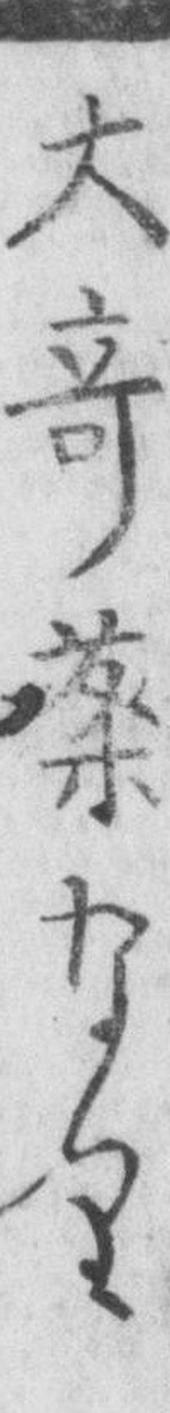大奇薬なり
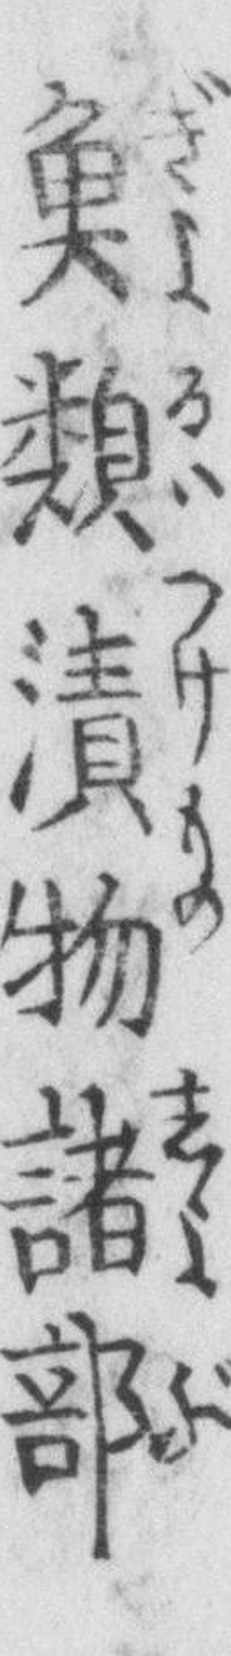魚類漬物諸部
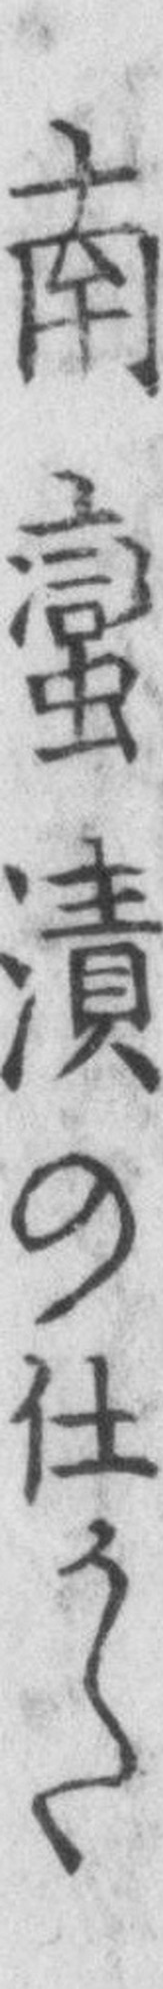南蛮漬の仕かた
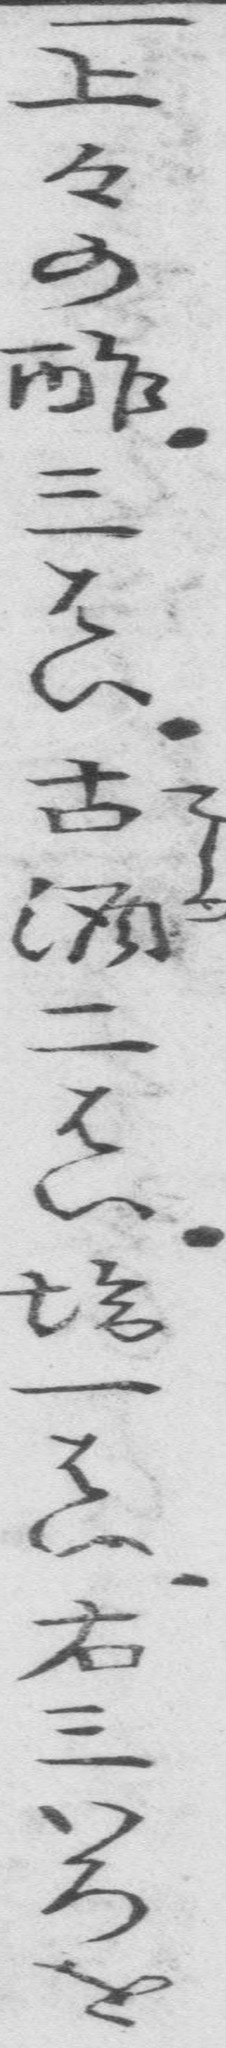一上々の酢。三はい。古酒二はい。塩一はい。右三いろを
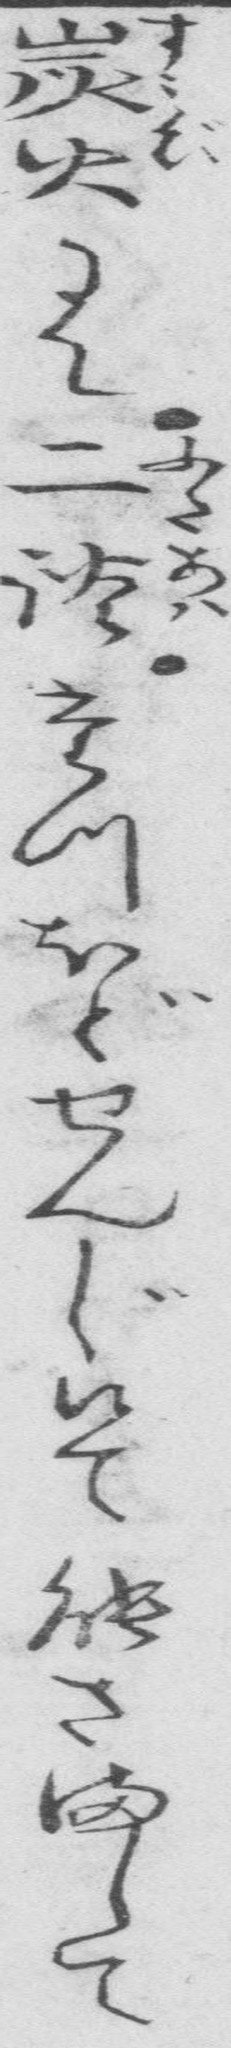炭火にて。二淡。たつほどせんじ候て能さまして
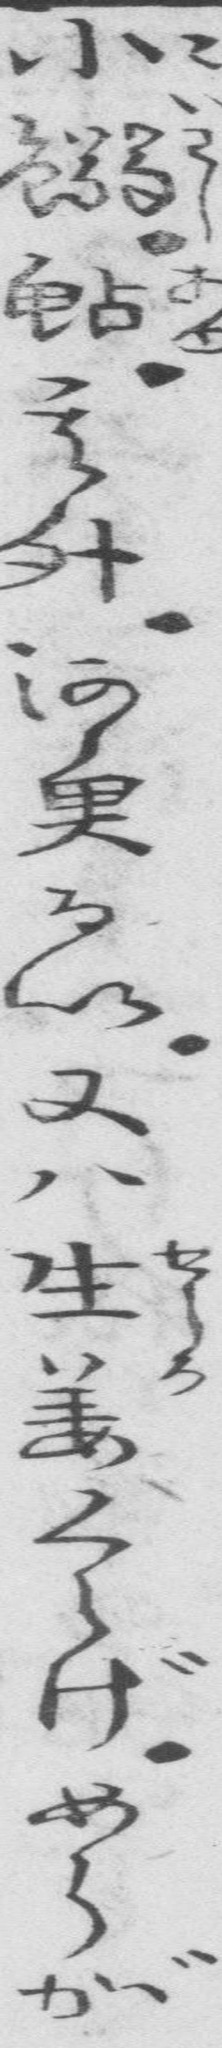小鰯。鮎。其外。河魚るい。又は生姜くらげ。めうが
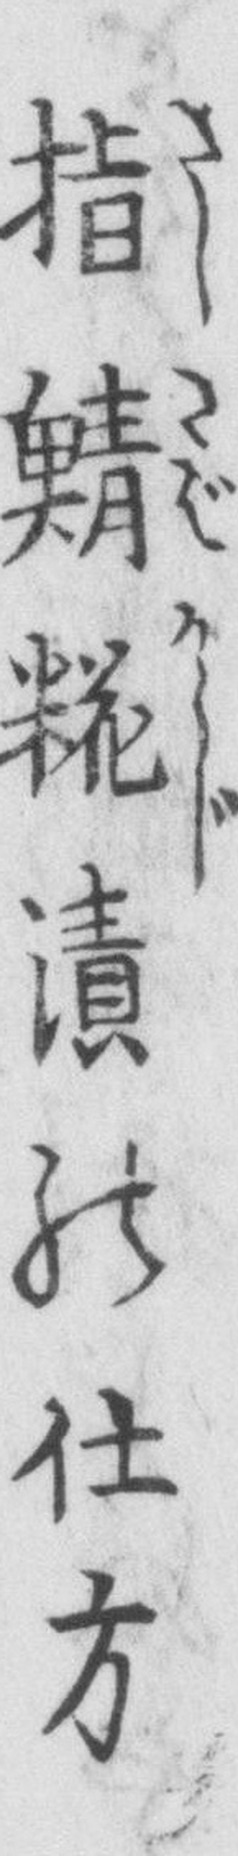指鯖糀漬の仕方
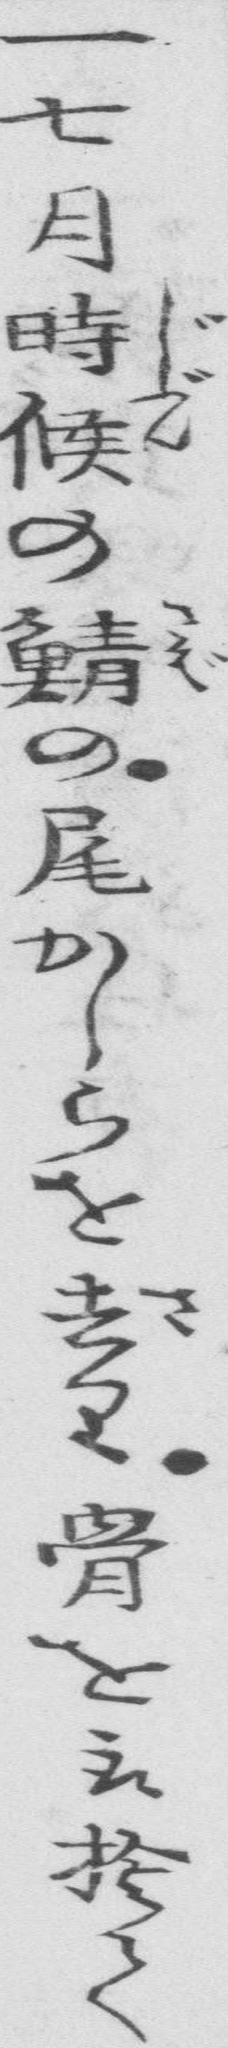一七月時候の鯖の。尾かしらを去り。骨を取捨て
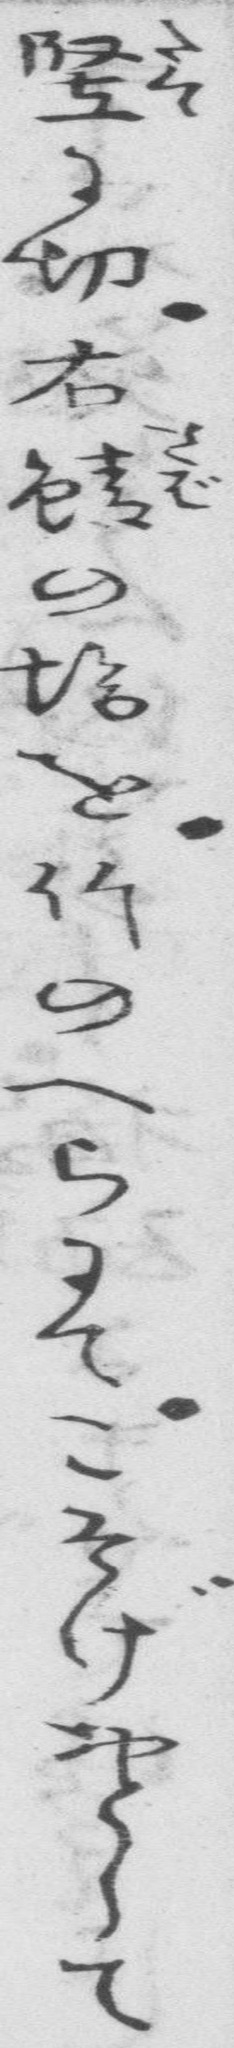竪に切。右鯖の塩を。竹のへらにて。こそげおとして
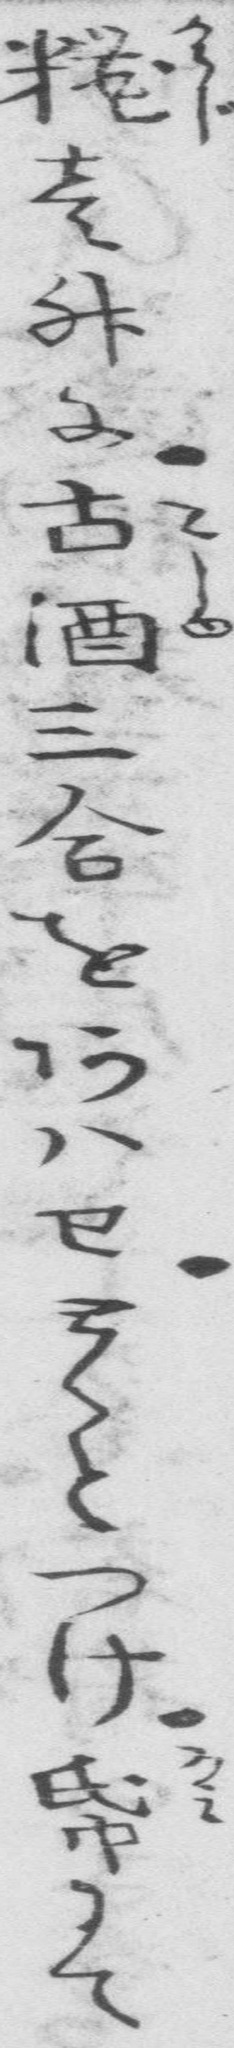糀壱升に。古酒三合をあはせ。とくとつけ。紙にて
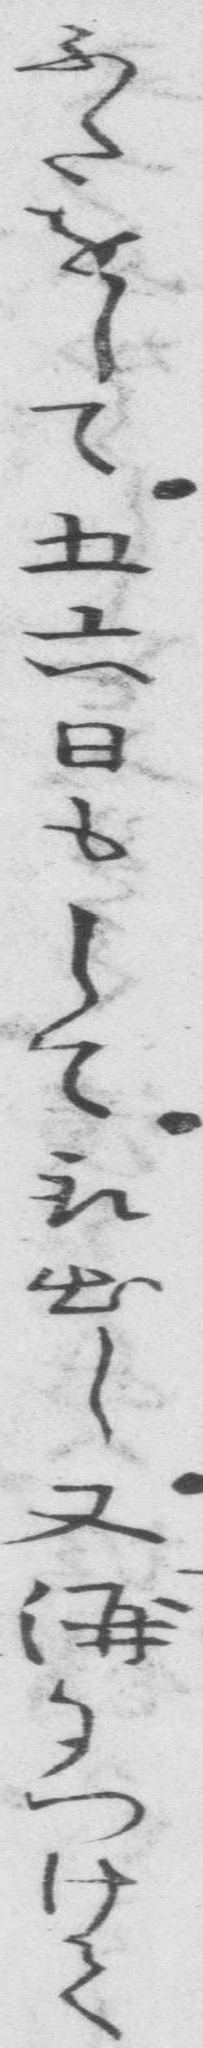ふたをして。五六日もして。取出し。又酒につけて
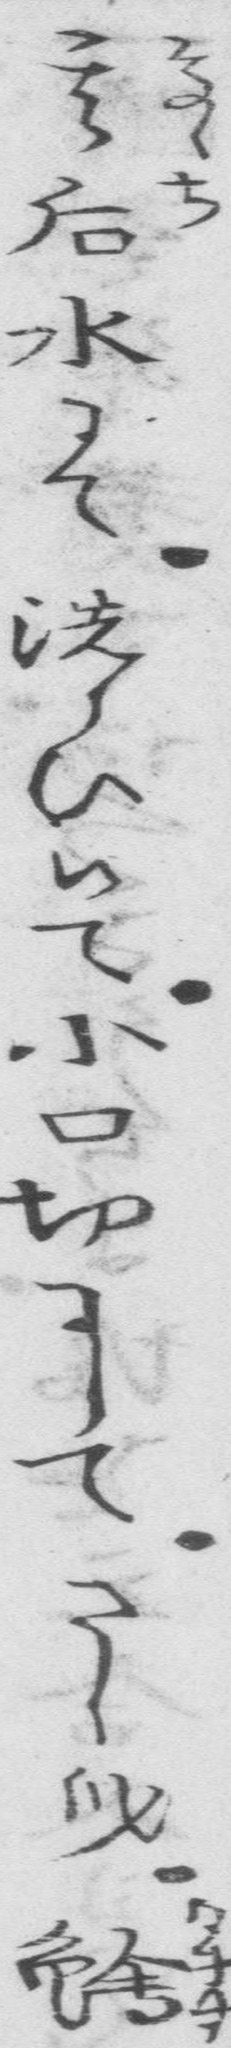其后水にて。洗らひ候て。小口切にして。さし身。鱠
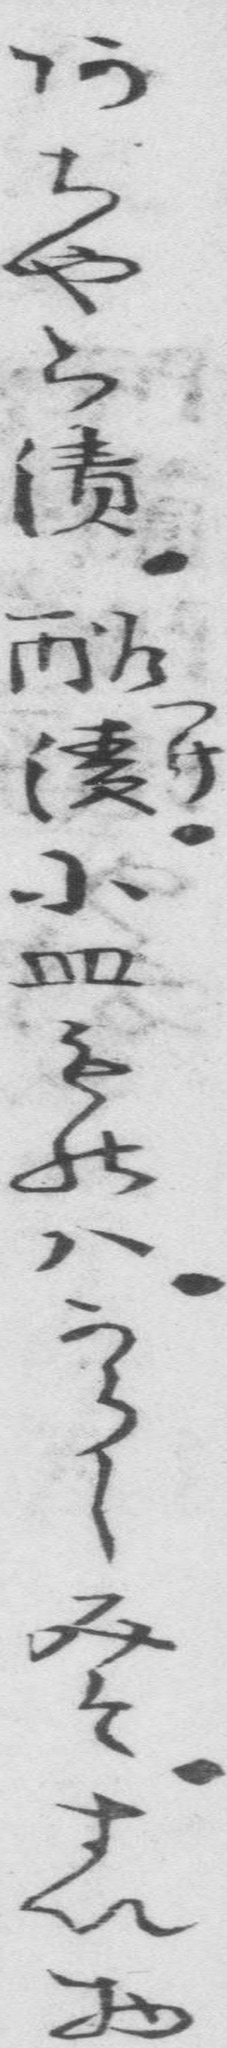あちやら漬。酢漬。小皿ものは。からしみそ。すい物
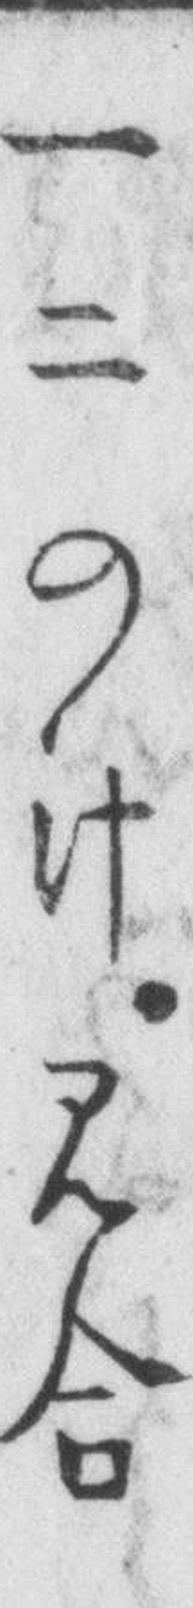一二の汁。見合
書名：萬寳料理秘密箱
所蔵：大阪府立大学学術情報センター 国文学研究資料館
